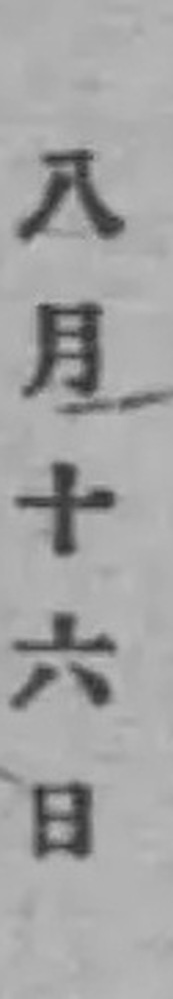八月十六日
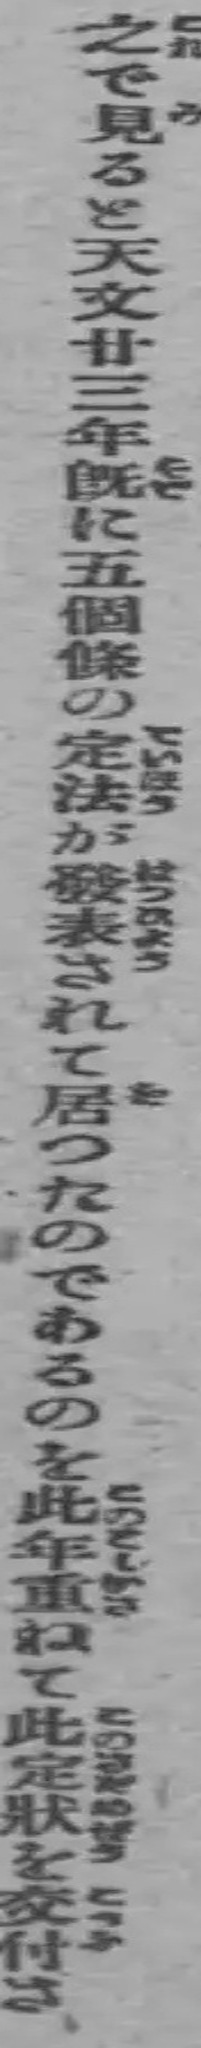之で見ると天文廿三年既に五個条の定法が発表されて居つたのであるのを此年重ねて此定状を交付さ
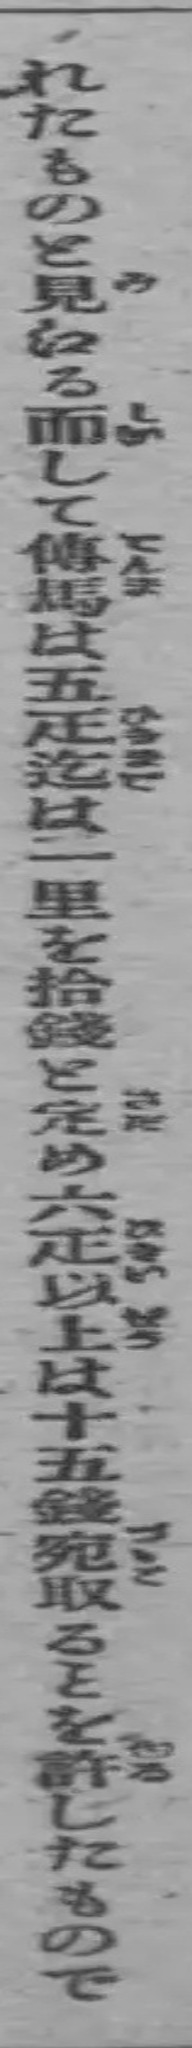れたものと見える而して伝馬は五疋迄は一里を拾銭と定め六疋以上は十五銭宛取ることを許したもので
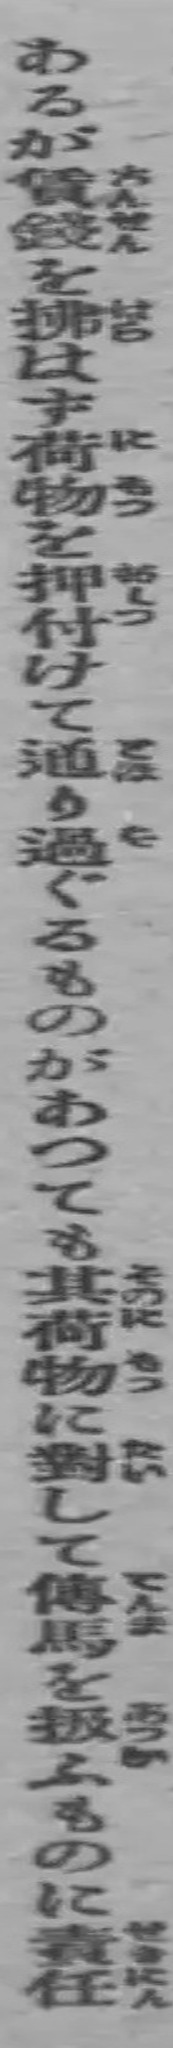あるが賃銭を払はず荷物を押付けて通り過ぐるものがあつても其荷物に対して伝馬を扱ふものに責任
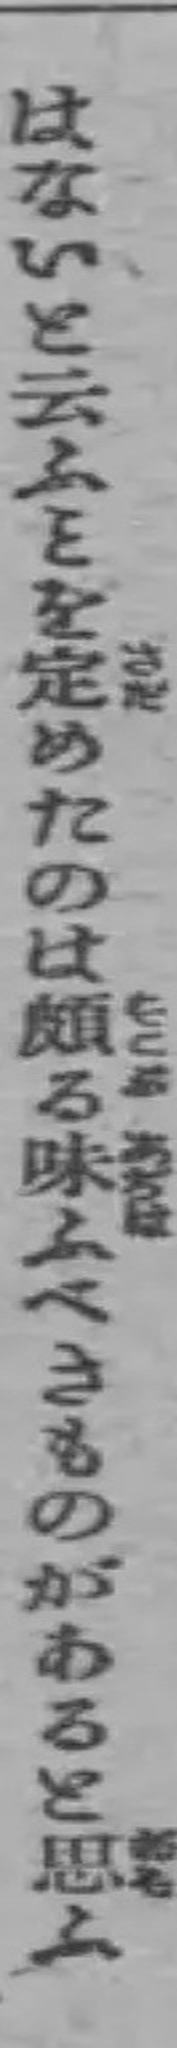はないと云ふことを定めたのは頗る味ふべきものがあると思ふ
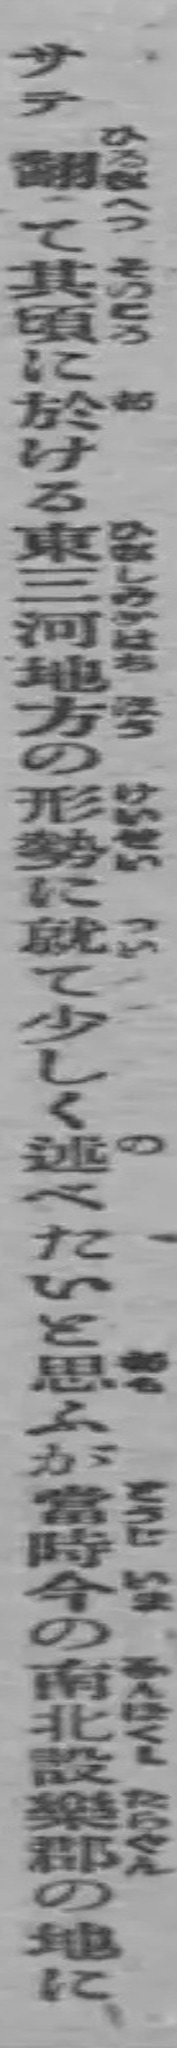サテ翻て其頃に於ける東三河地方の形勢に就て少しく述べたいと思ふが当時今の南北設楽郡の地に
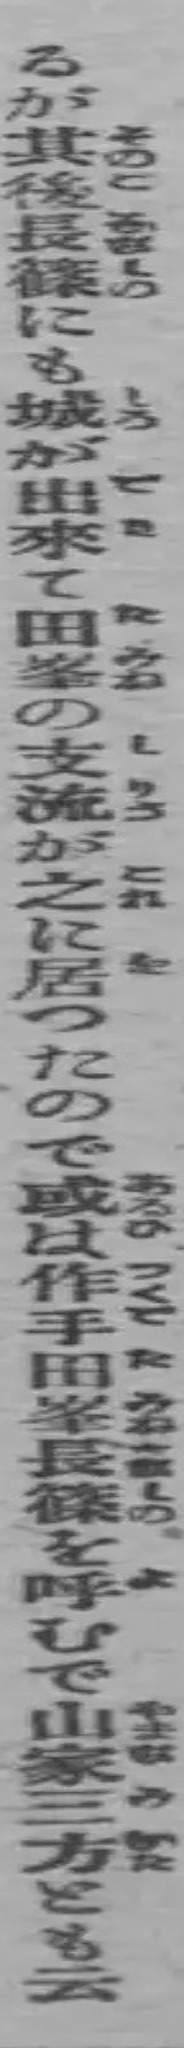るが其後長篠にも城が出来て田峯の支流が之に居つたので或は作手田峯長篠を呼むで山家三方とも云
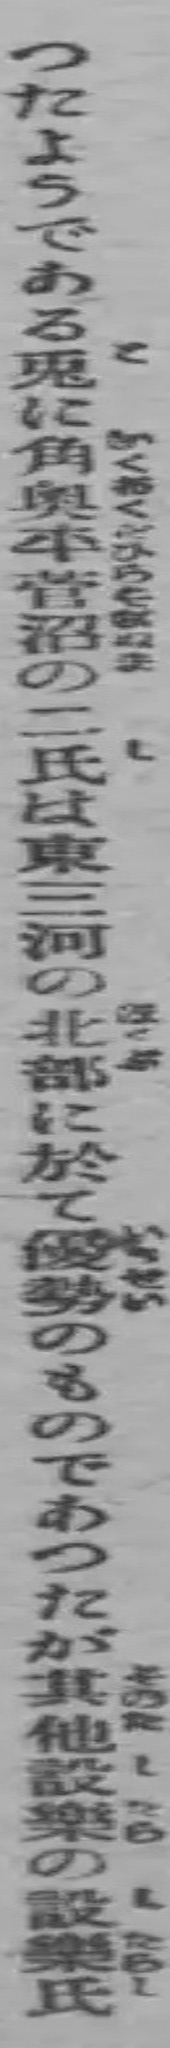山家三方つたようである兎に角奥平菅沼の二氏は東三河の北部に於て優勢のものであつたが其他設楽の設楽氏
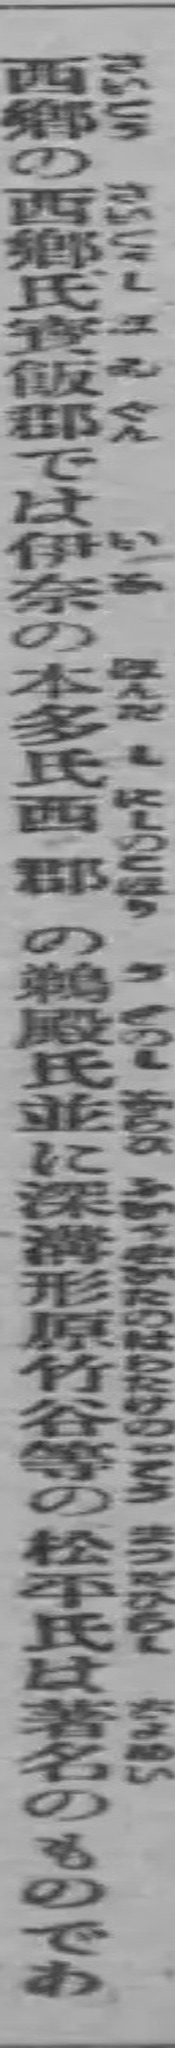西郷の西郷氏宝飯郡では伊奈の本多氏西郡の鵜殿氏並に深溝形原竹谷等の松平氏は著名のものであ
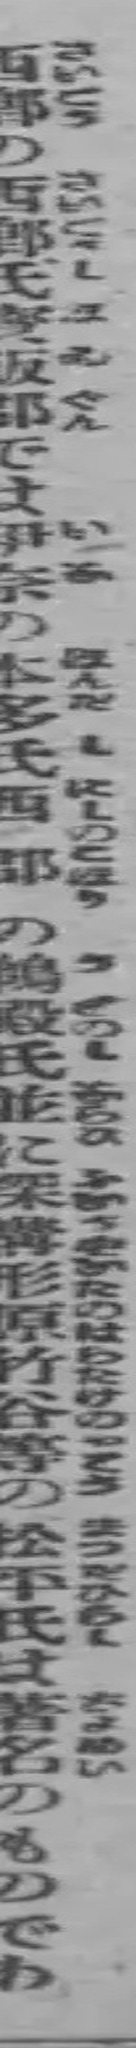西郷の西郷氏宝飯郡では伊奈の本多氏西郡の鵜殿氏並に深溝形原竹谷等の松平氏は著名のものであ
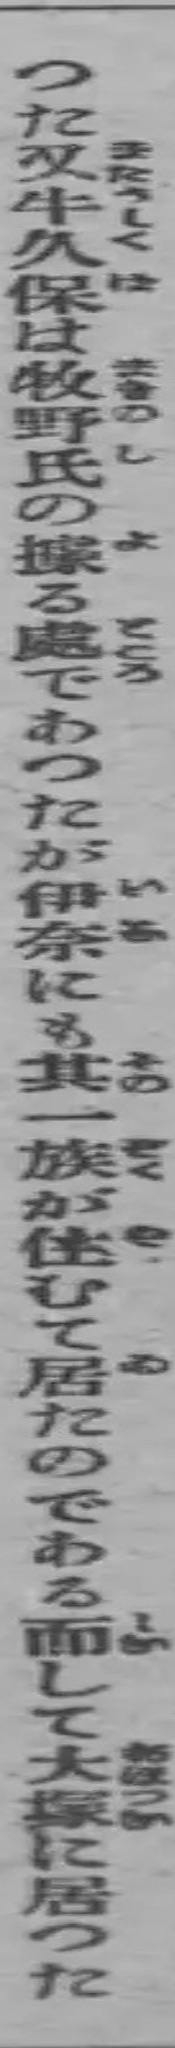つた又牛久保は牧野氏の拠る処であつたが伊奈にも其一族が住むて居たのである而して大塚に居つた
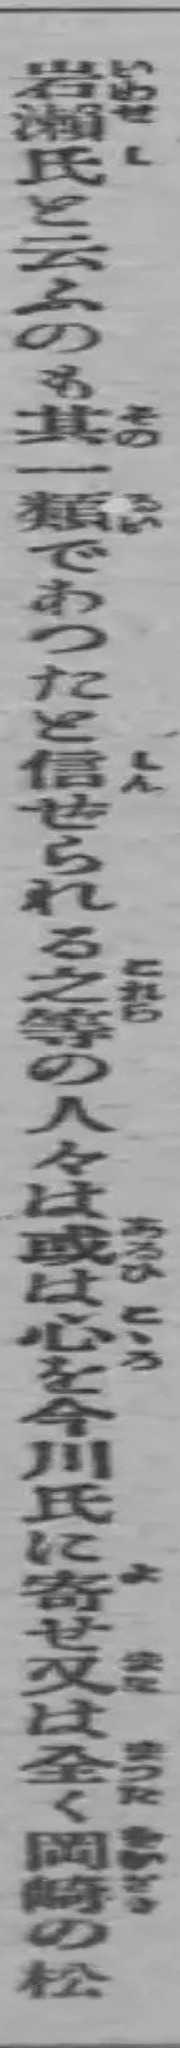岩瀬氏と云ふのも其一類であつたと信ぜられる之等の人々は或は心を今川氏に寄せ又は全く岡崎の松
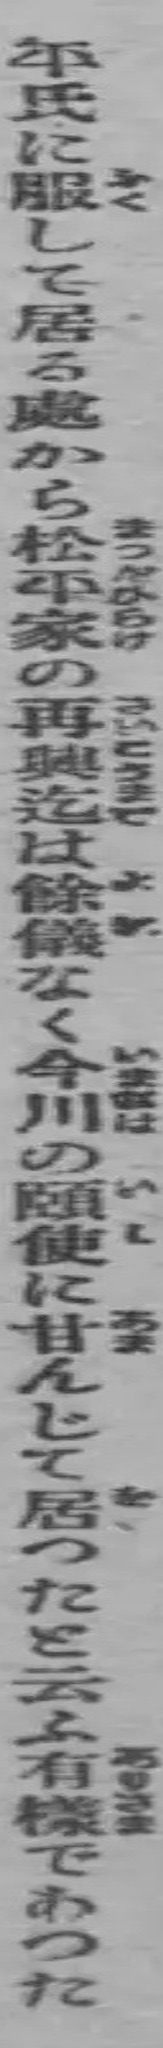平氏に服して居る処から松平家の再興迄は余儀なく今川の頤使に甘んじて居つたと云ふ有様であつた
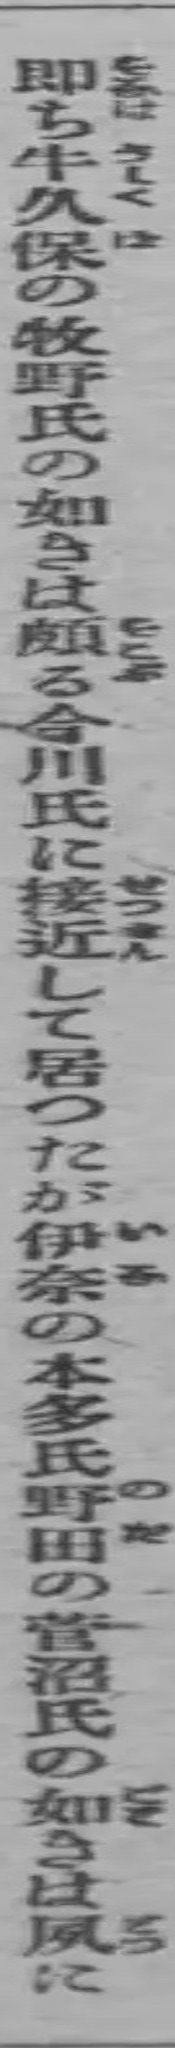即ち牛久保の牧野氏の如きは頗る今川氏に接近して居つたが伊奈の本多氏野田の菅沼氏の如きは夙に
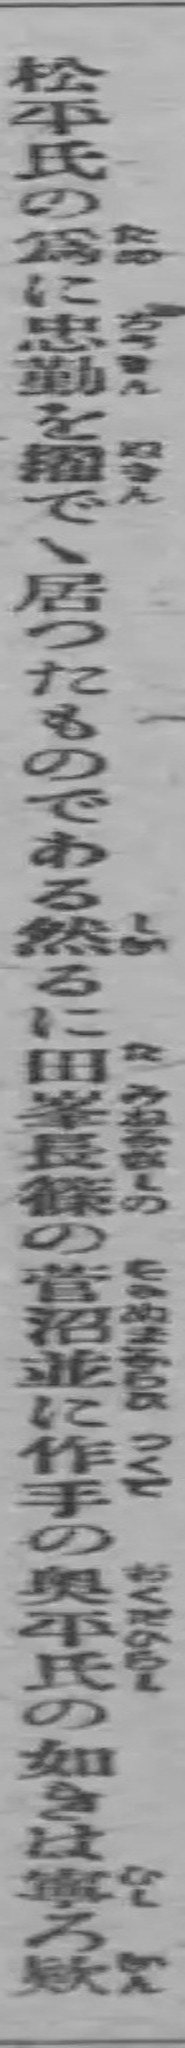松平氏の為に忠勤を擢でゝ居つたものである然るに田峯長篠の菅沼並に作手の奥平氏の如きは寧ろ欵
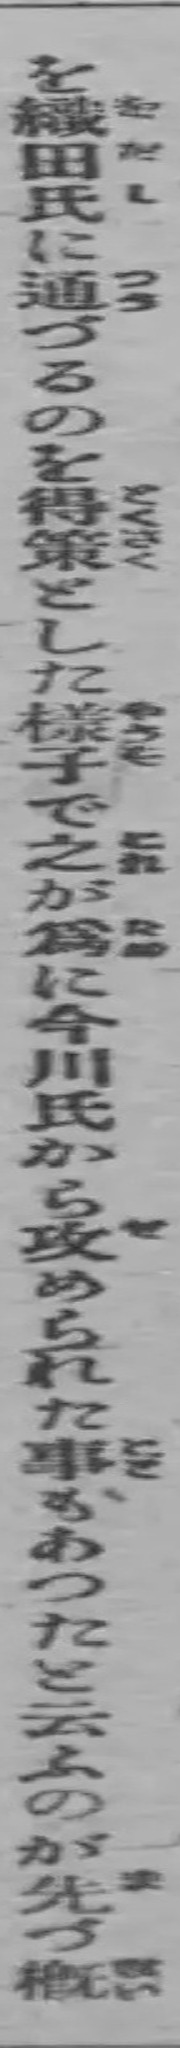を織田氏に通づるのを得策とした様子で之が為に今川氏から攻められた事もあつたと云ふのが先づ概
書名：豊橋市史談
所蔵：国立国会図書館 National Diet Library, JAPAN
